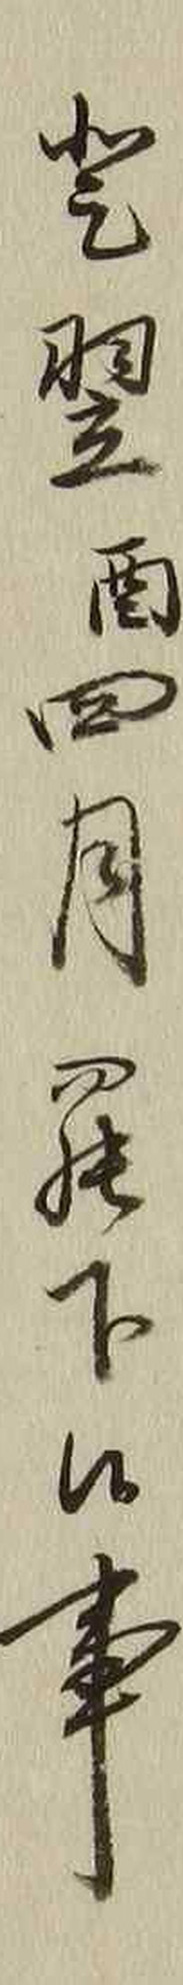登翌酉四月罷下候事
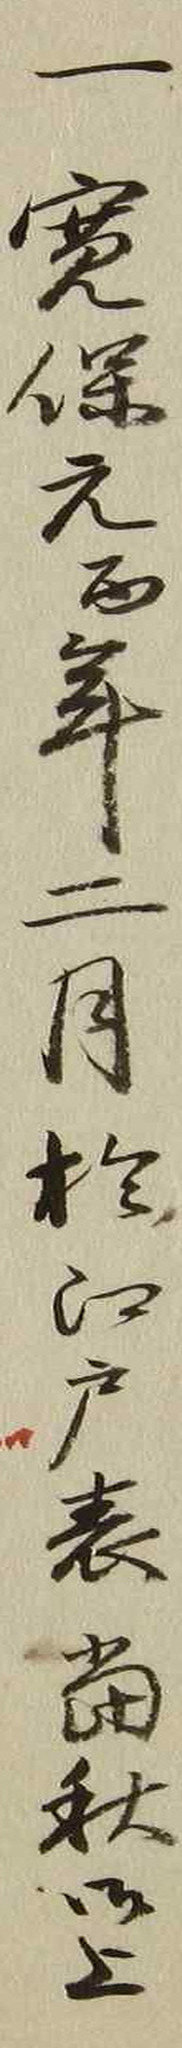一寛保元酉年二月於江戸表当秋御上
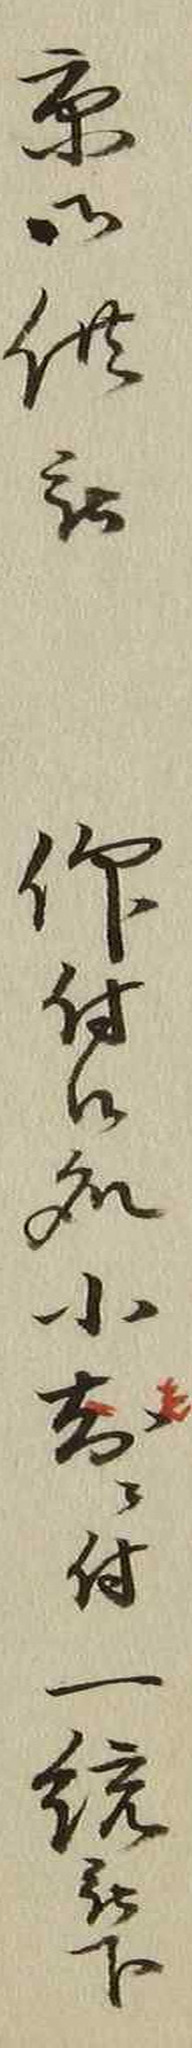京御供被仰付候処小知に付一統被下
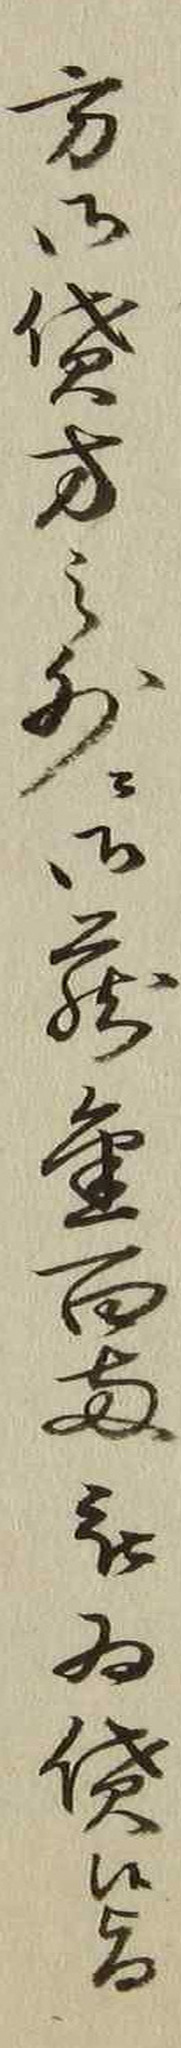方御貸方之外に御蔵金百両被為貸候旨
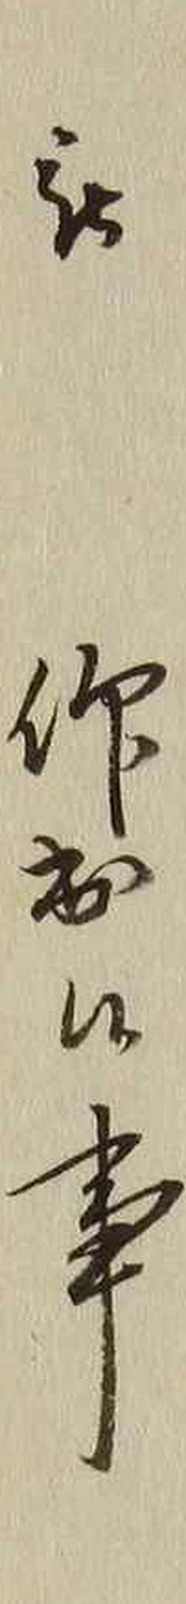被仰出候事
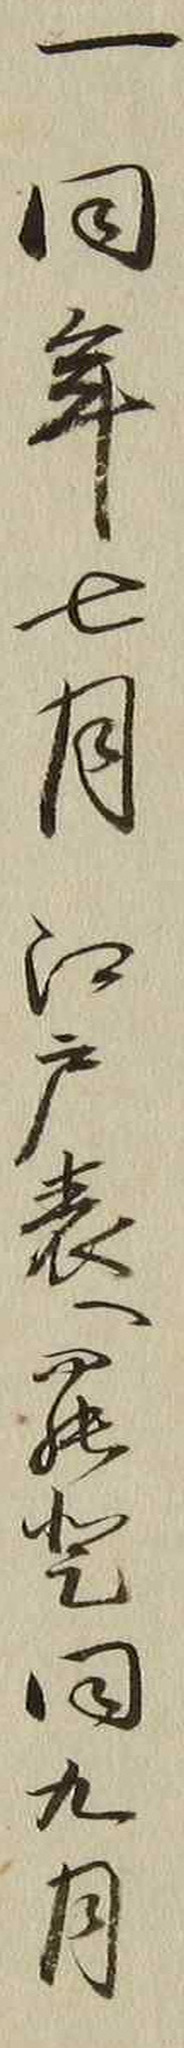一同年七月江戸表へ罷登同九月
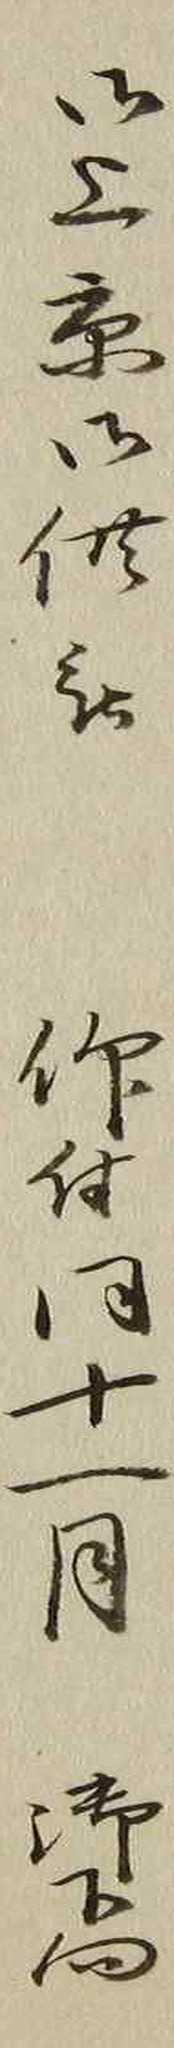御上京御供被仰付同十一月御下向
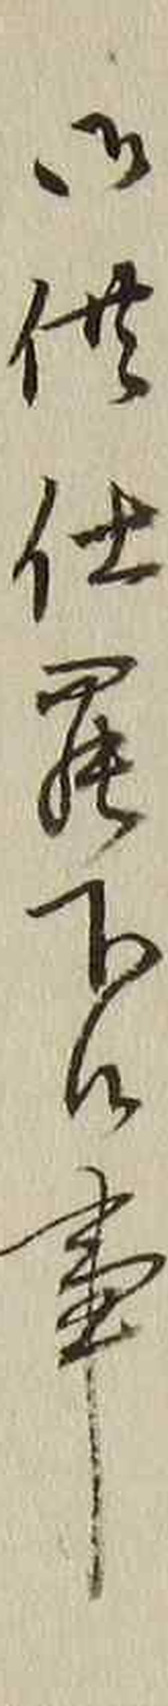御供仕罷下候事
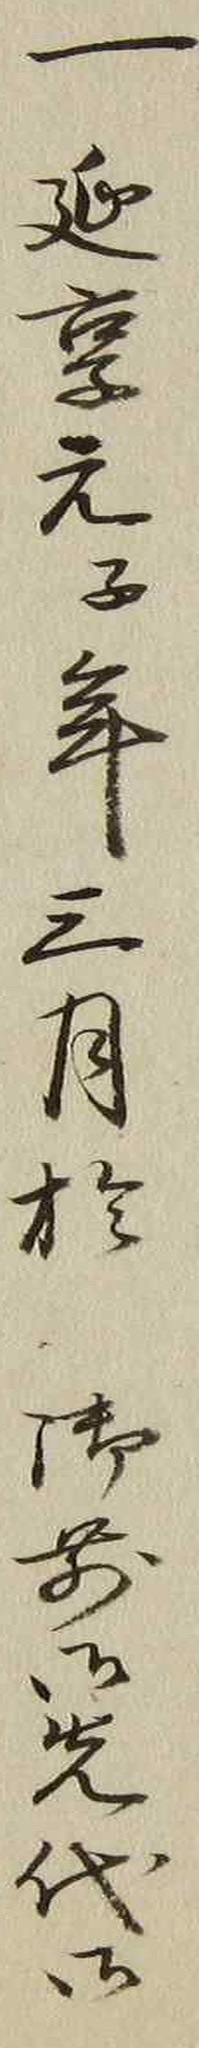一延享元子年三月於御前御先代御
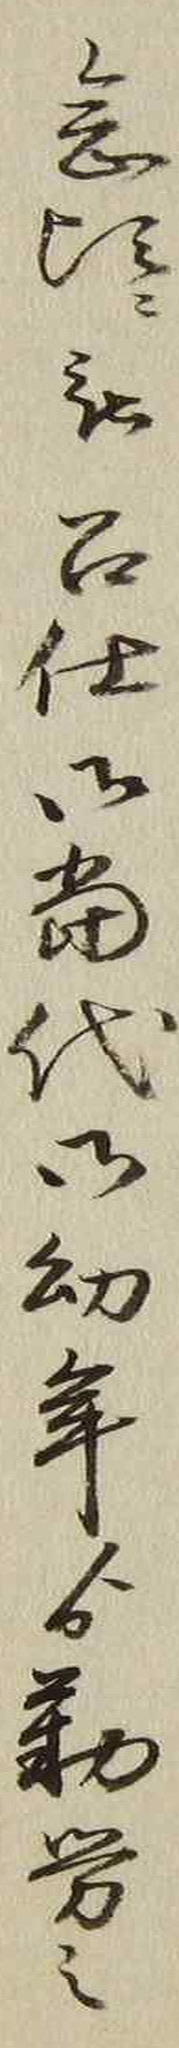念頃に被召仕御当代御幼年ゟ勤労之
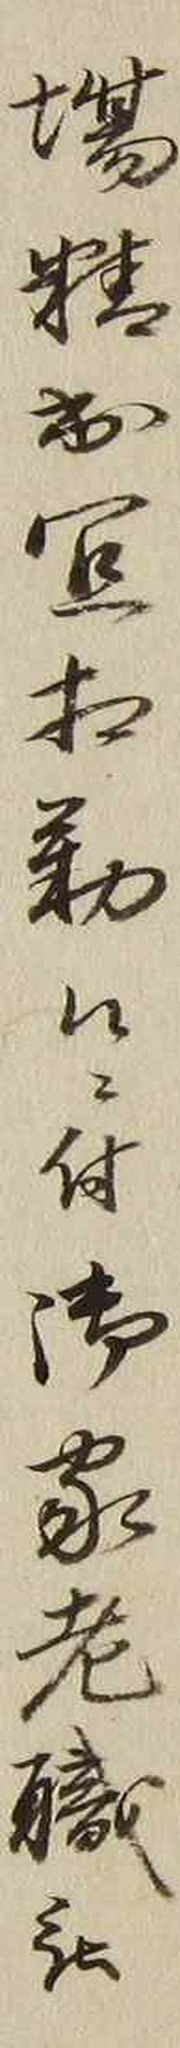場精出宜相勤候に付御家老職被
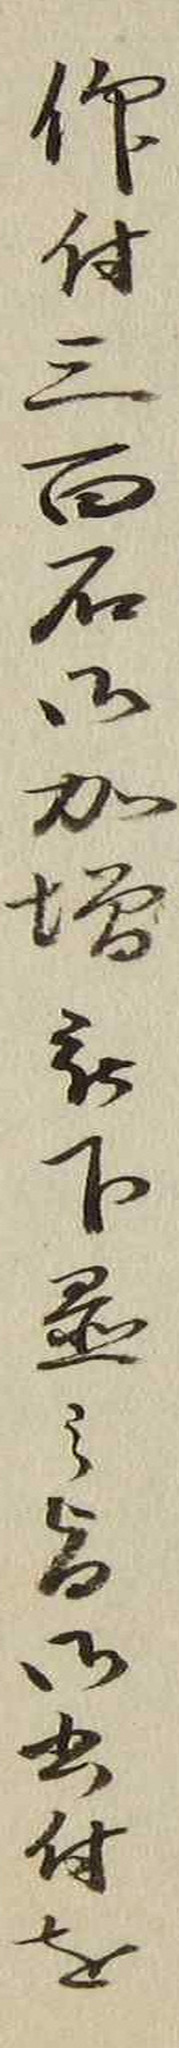仰付三百石御加増被下置之旨御書付を
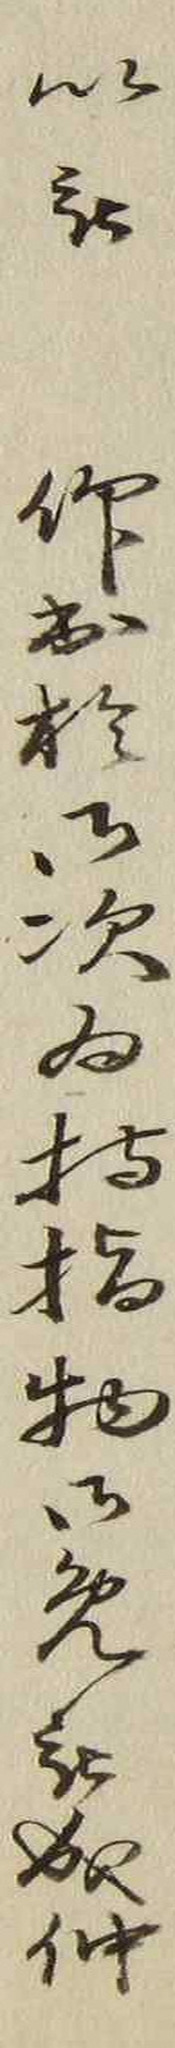以被仰出於御次為持指物御免被成仲
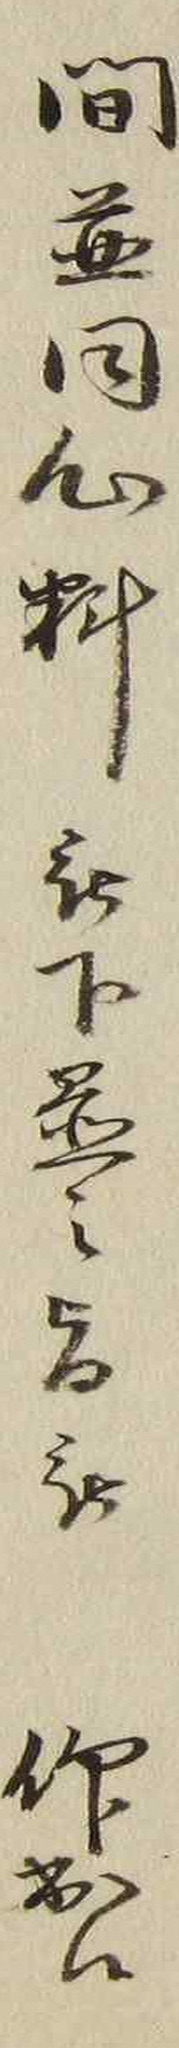間並同心料被下置之旨被仰出候

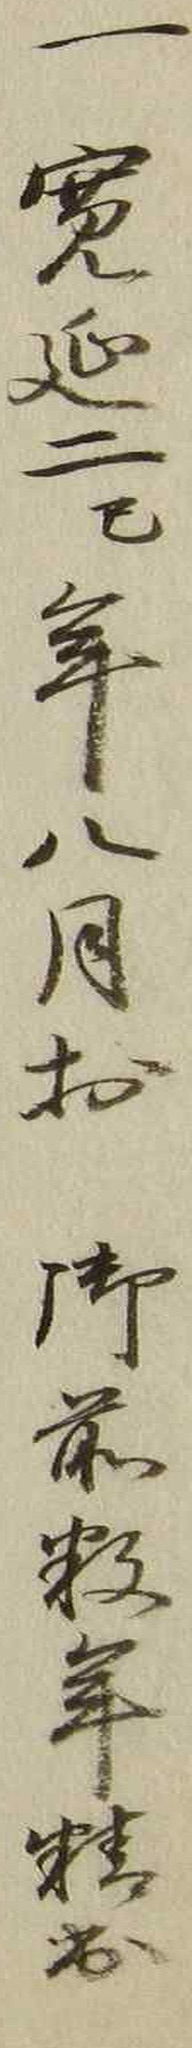一寛延二巳年八月於御前数年精出
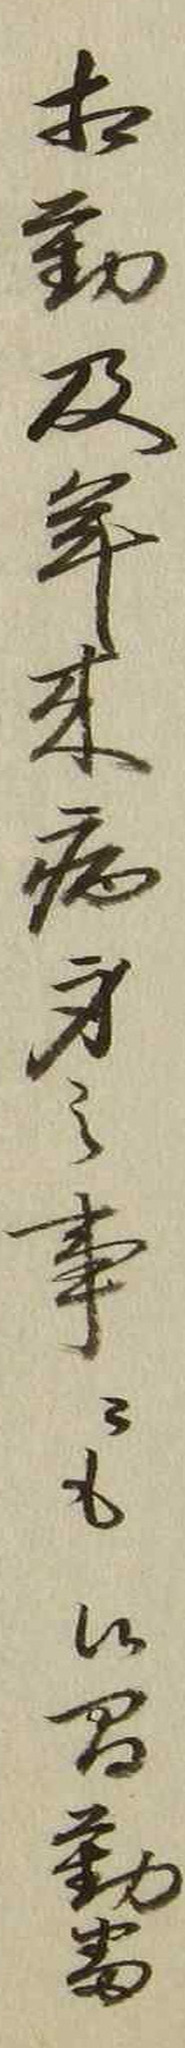相勤及年来病身之事にも候間勤番
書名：諸士系譜　巻之133　た之部9
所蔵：会津若松市立会津図書館
